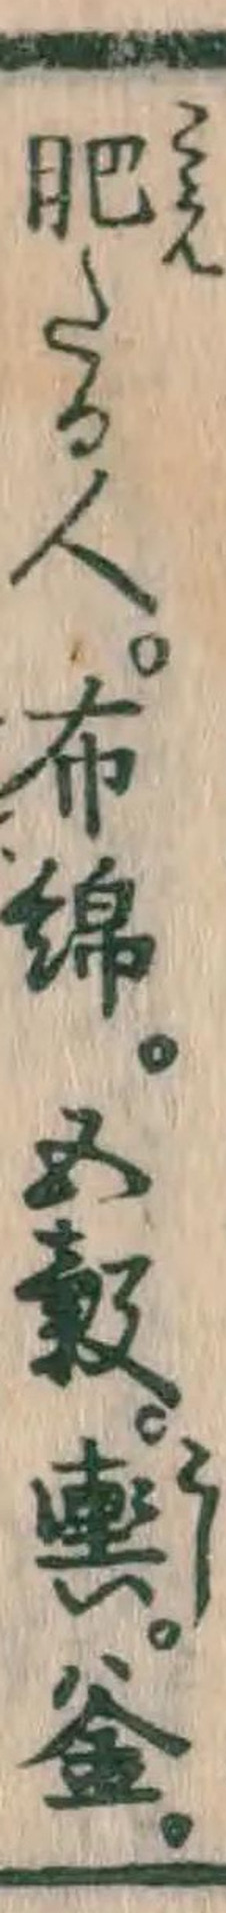肥たる人。布綿。五穀。輿。釜。
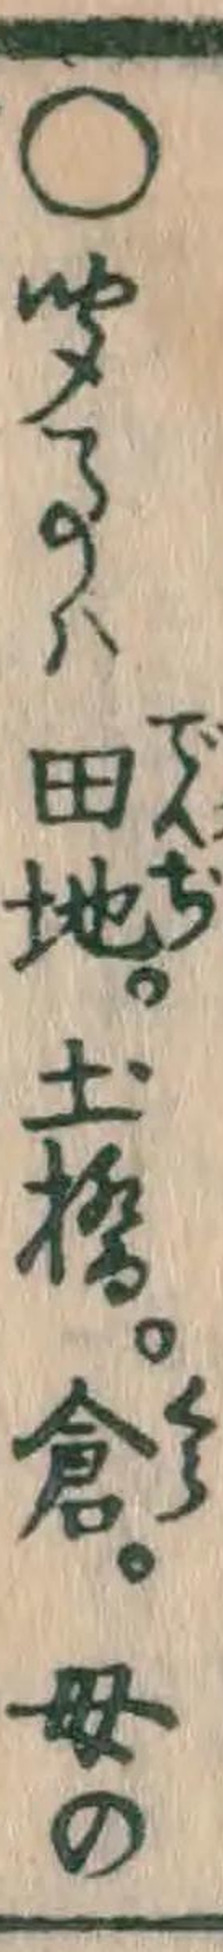○聞事は田地。土橋。倉。母の
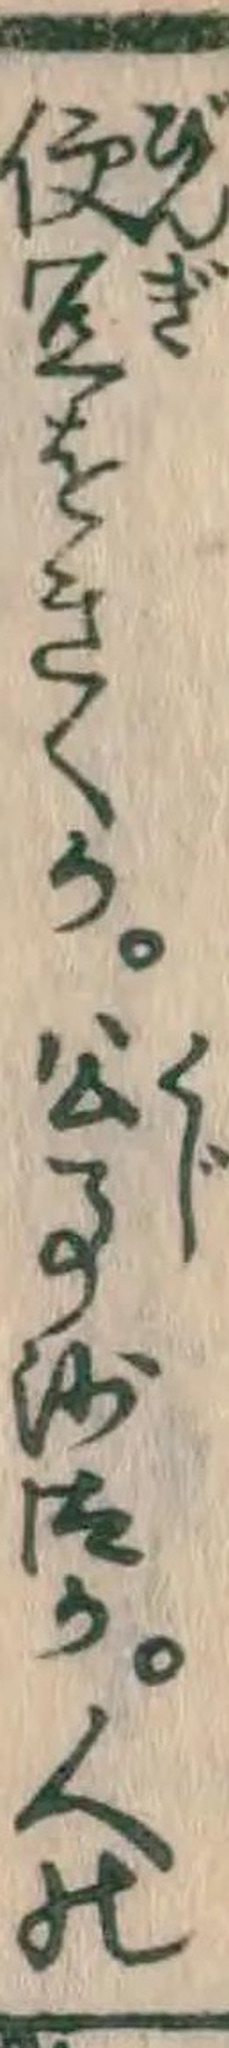便宜をきくか。公事沙汰か。人の
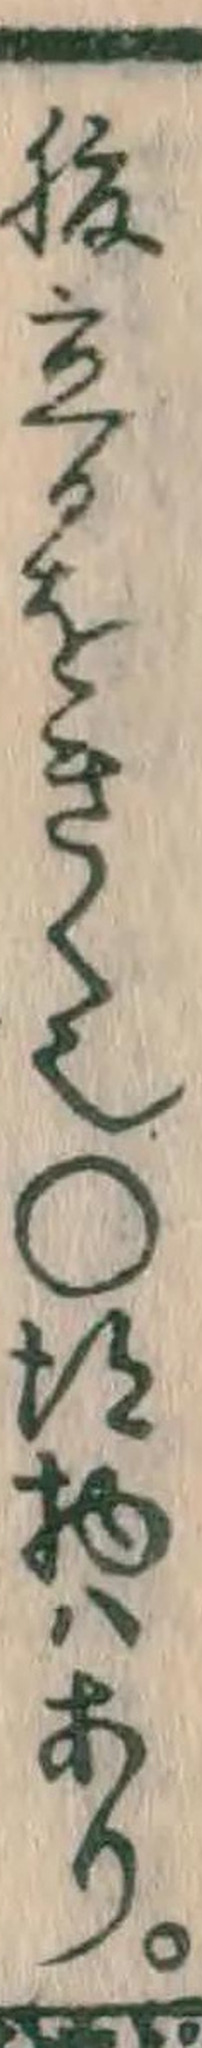腹立るをきく也○得物はあり。
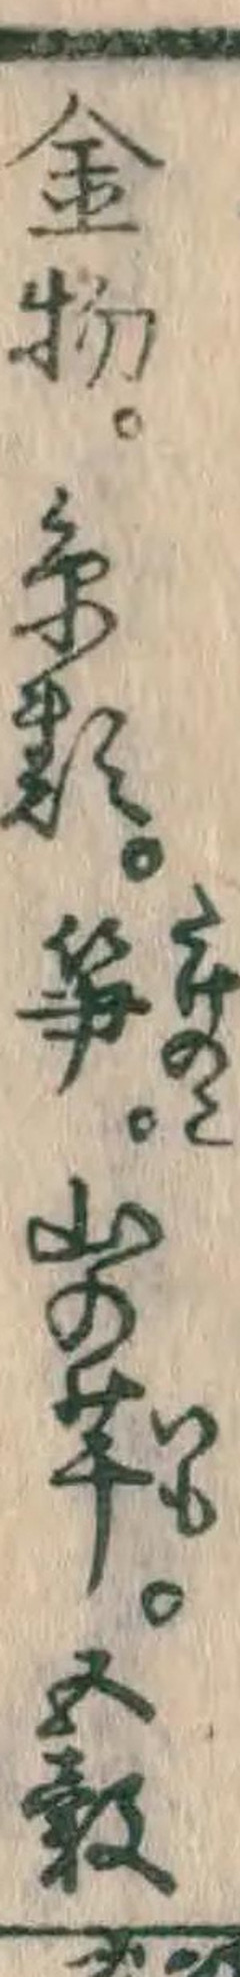金物。糸類。笋。山の芋。五穀
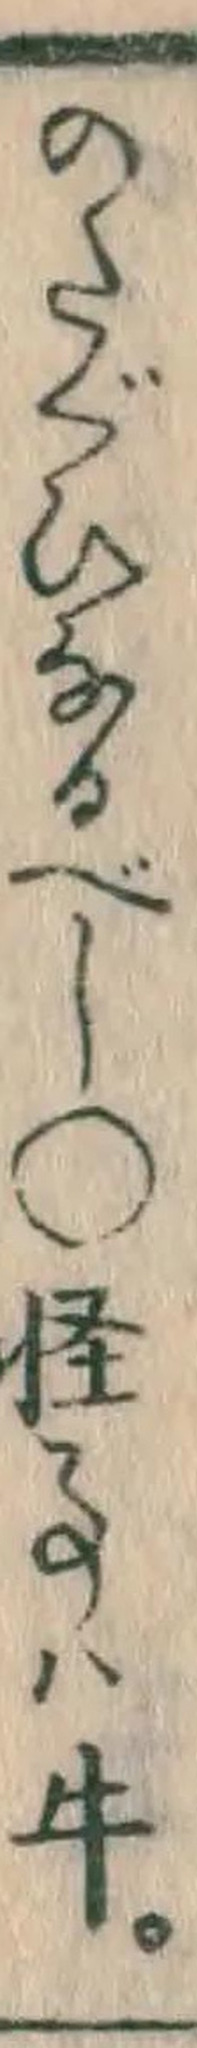のたぐひなるべし○怪事は牛。
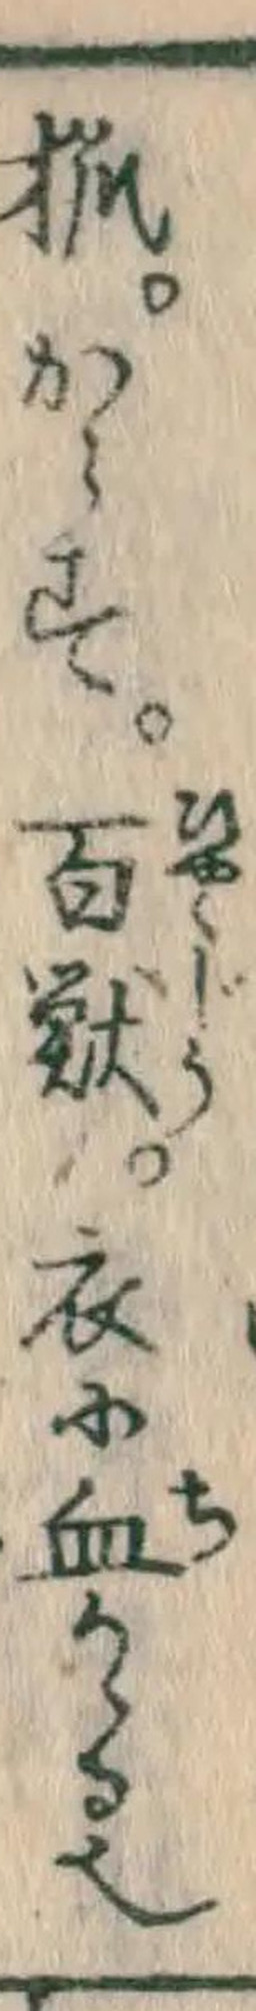狐。からす。百獣。衣に血かゝる也
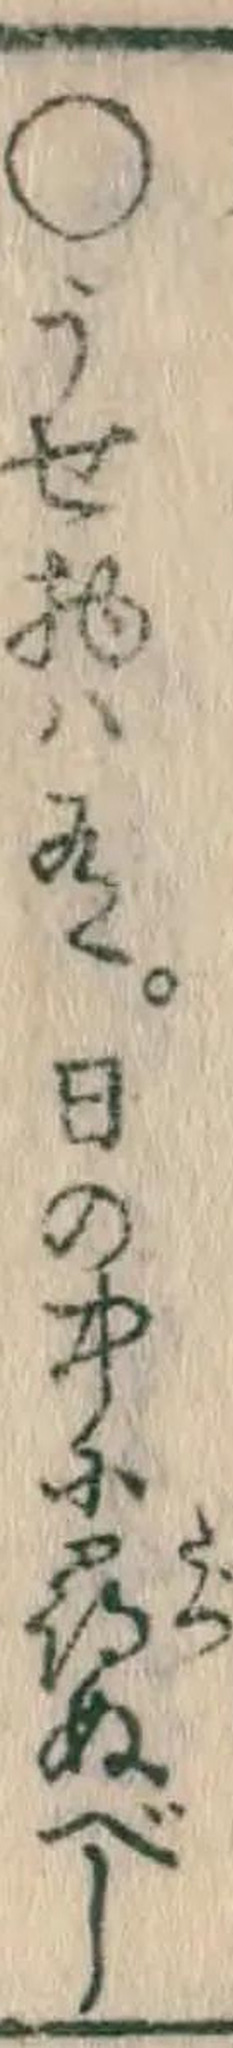○うせ物は有。日の中に尋ぬべし
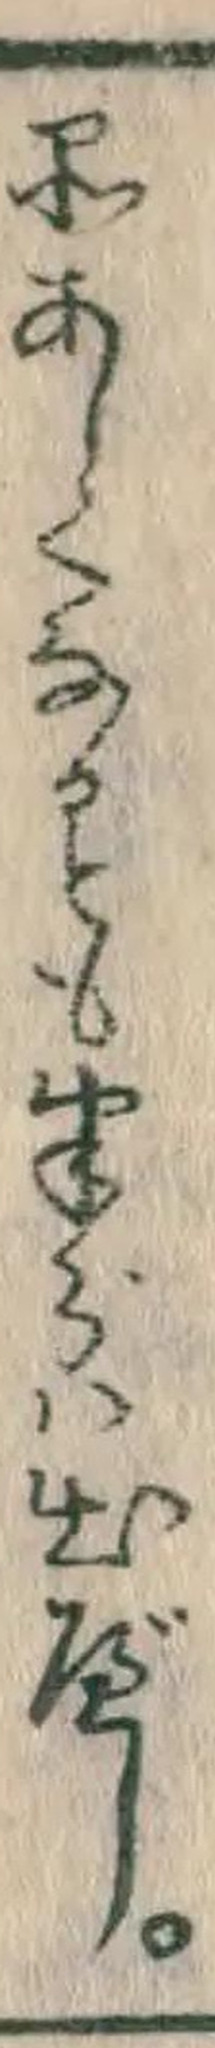品あしくなるとも半分は出べし。
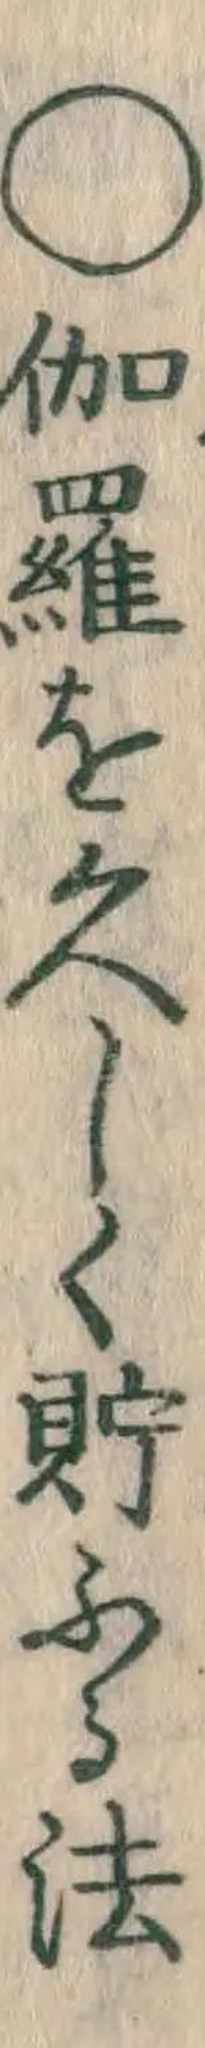○伽羅を久しく貯ふる法
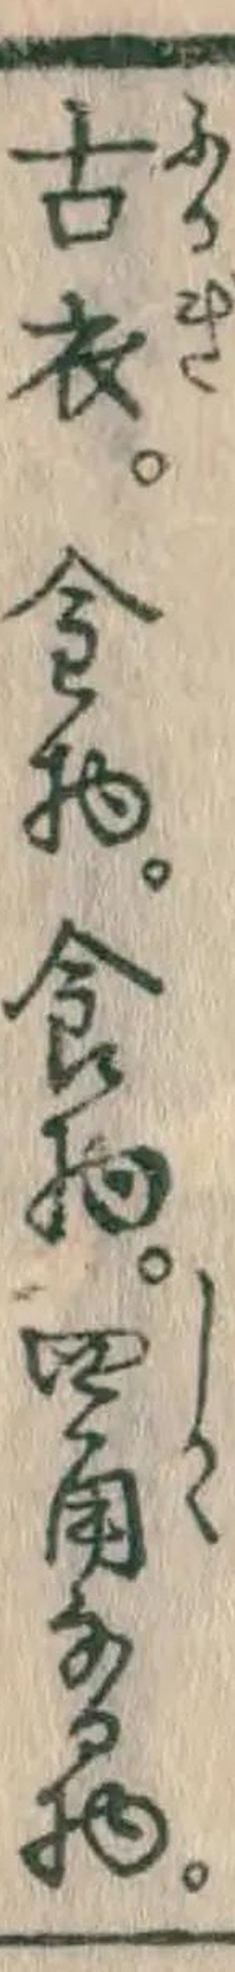古着。金物。食物。四角なる物。
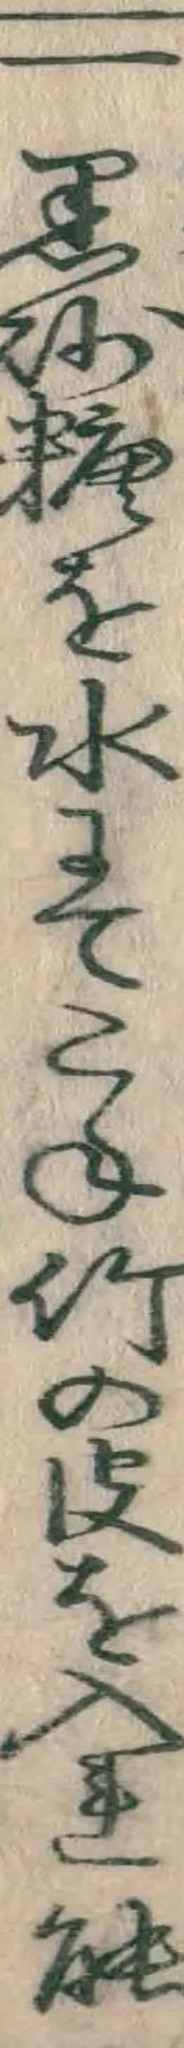一黒砂糖を水にてこね竹の皮を入れ能
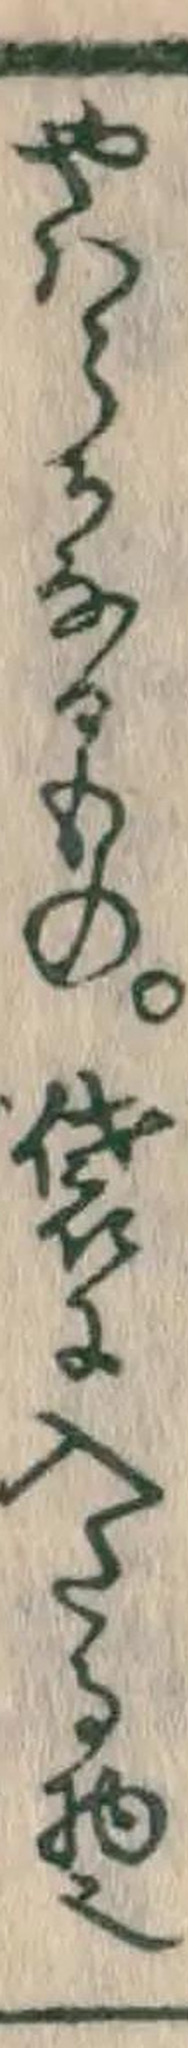やはらかなるもの。袋に入たる物也
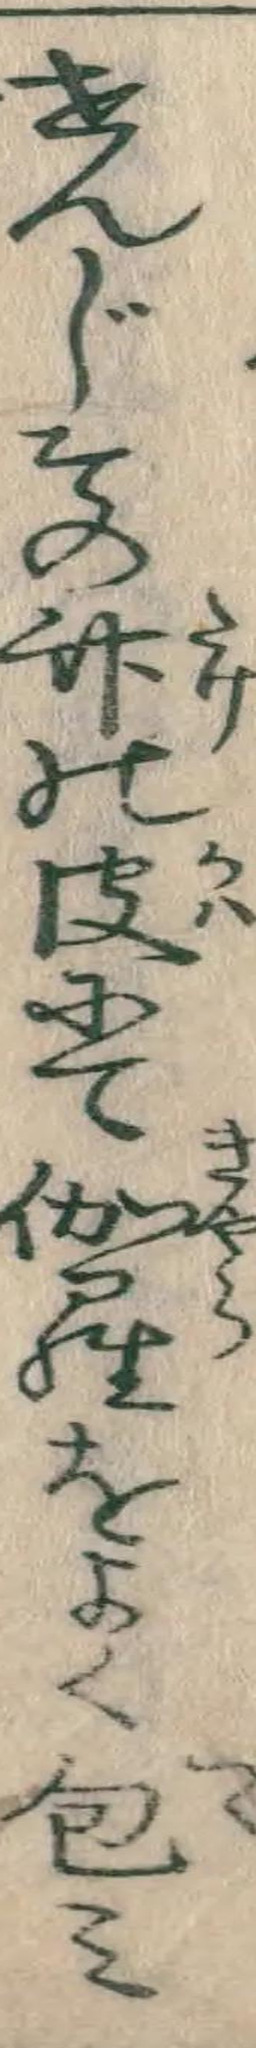せんじその竹の皮にて伽羅をよく包み
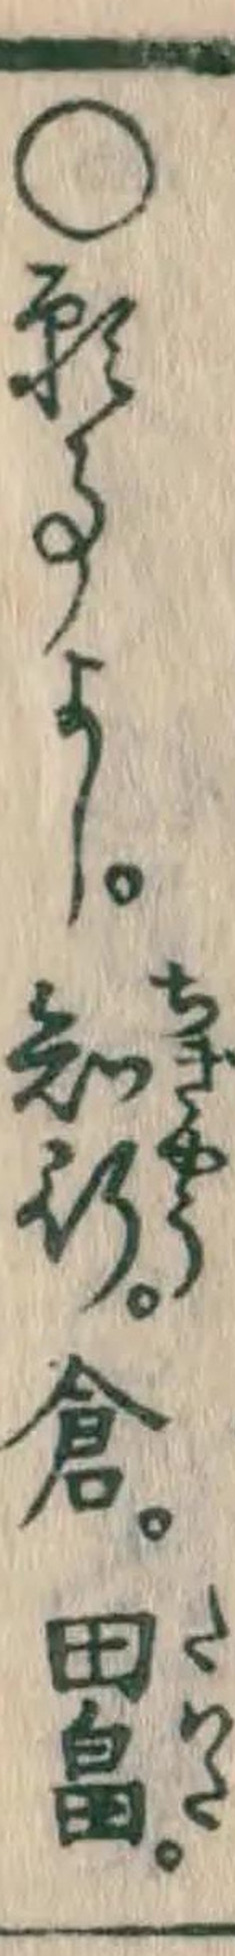○願事よし。知行。倉。田畠。
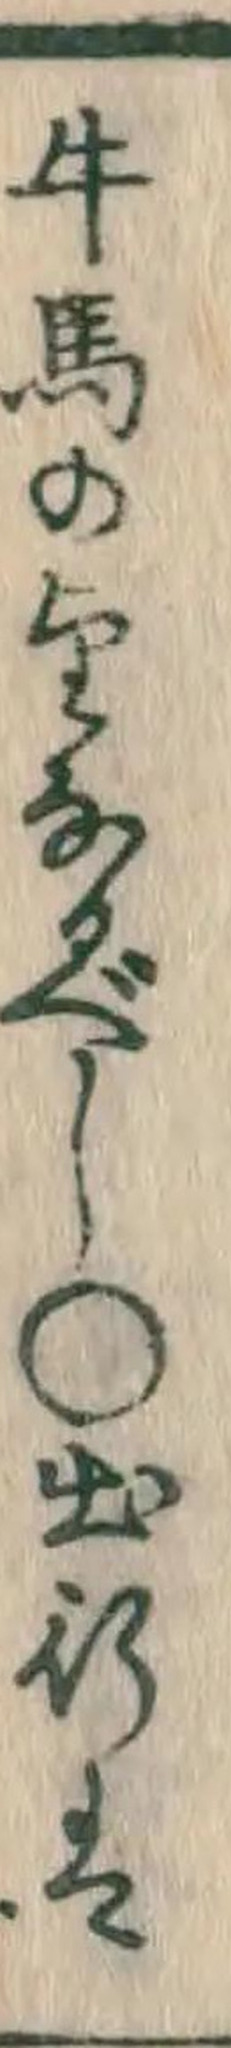牛馬の望なるべし○出行は
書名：広益秘事大全 3巻. [1]
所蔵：国立国会図書館 National Diet Library, JAPAN
